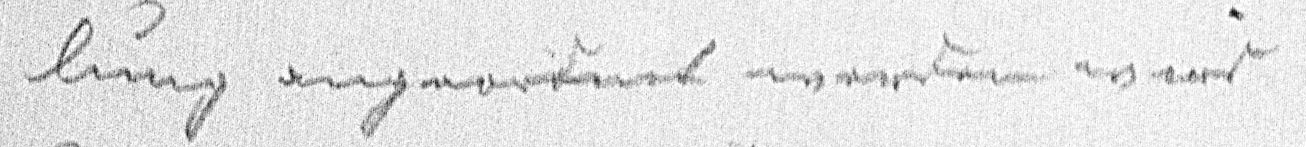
lung angeordnet werden wird
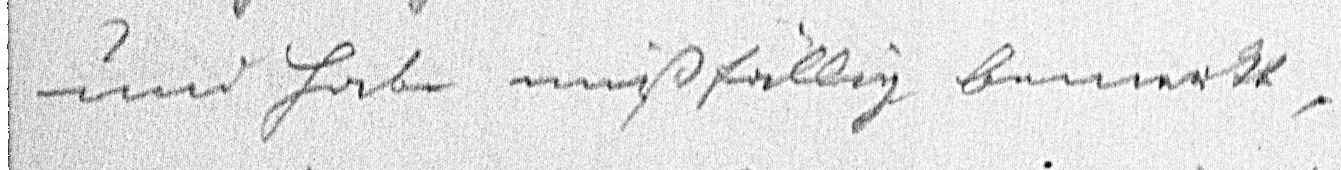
und habe mißfällig bemerkt,
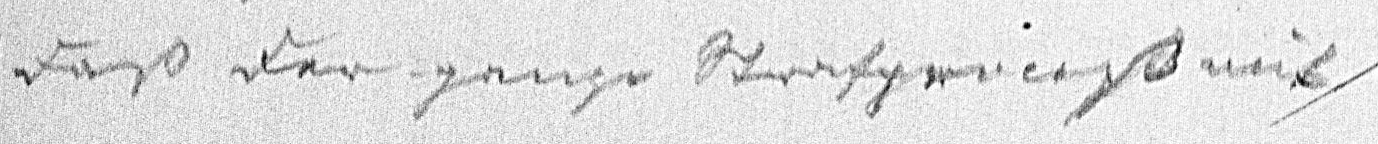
daß der ganze Strafproceß mit
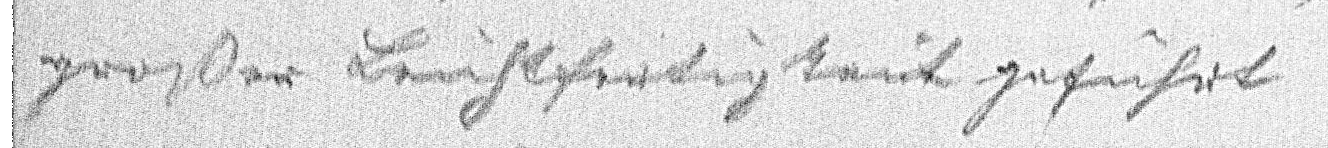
großer Leichtfertigkeit geführt
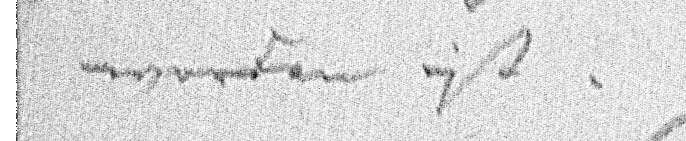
worden ist.
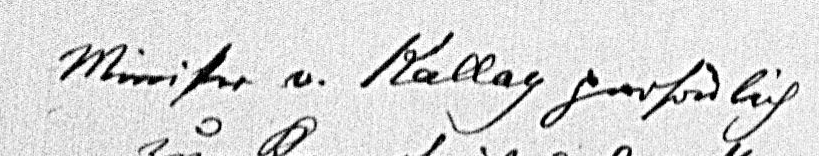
Minister v. Kallay persönlich
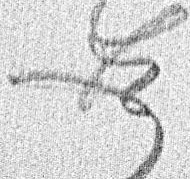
xx
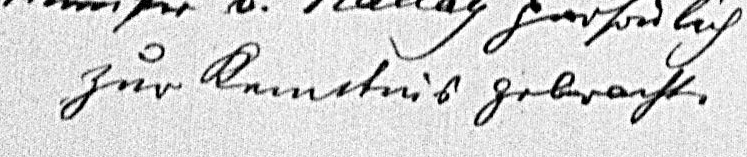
zur Kenntnis gebrachte.
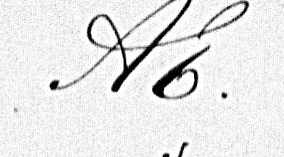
AE.
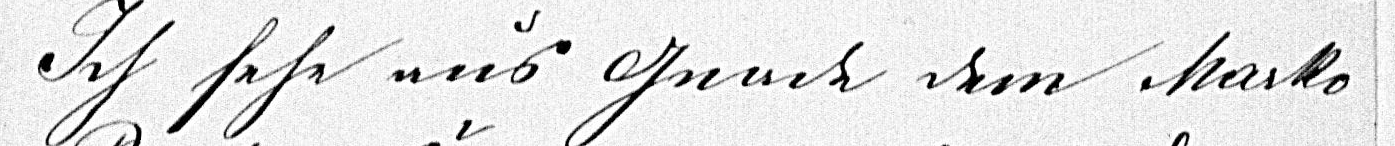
Ich sehe aus Gnade dem Marko
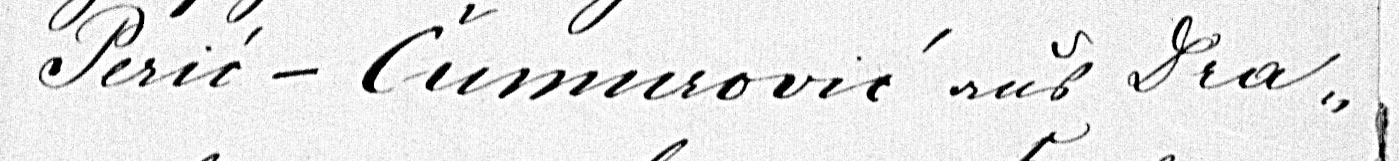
Perić - Cumurović aus Dra¬
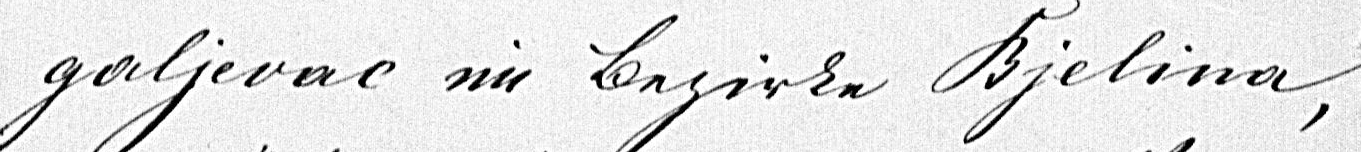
goljevac im Bezirke Bjelina,
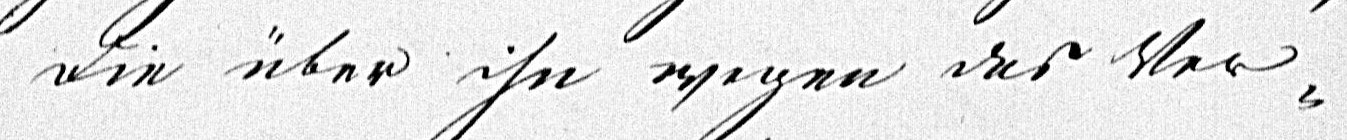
die über ihn wegen des Ver¬
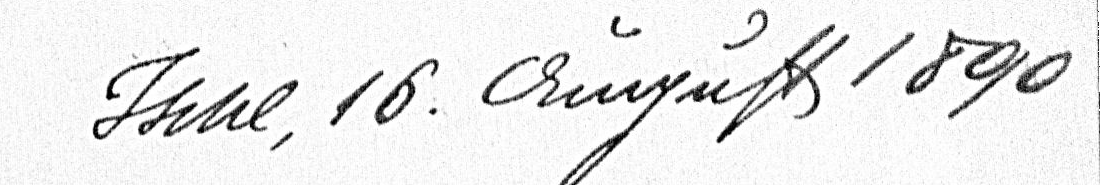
Mal, 16. August 1890
